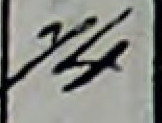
74
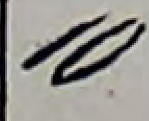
10
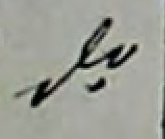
do
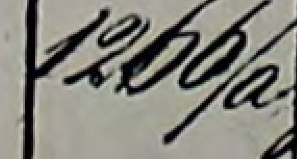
1266/a
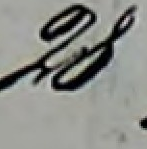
28
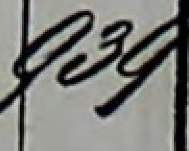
939
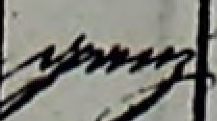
ganz
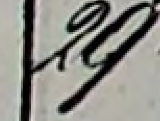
29
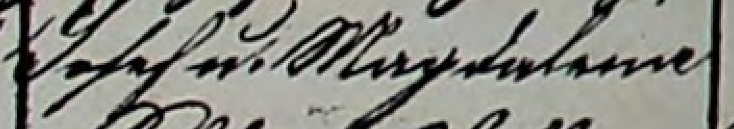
Josef u Magdalena
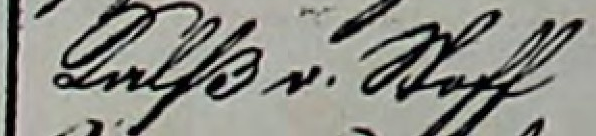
Kalß v. Stoff
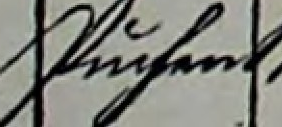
Puchen
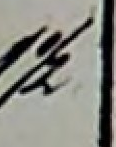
1 ½
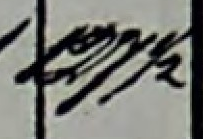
127 ½
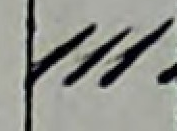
111
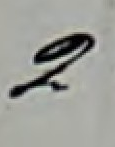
2
